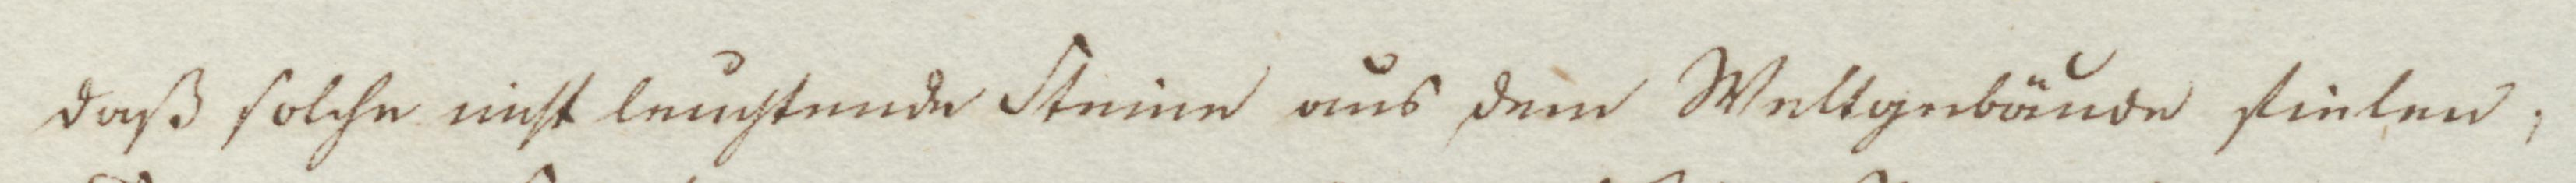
daß solche nicht leuchtende Steine aus dem Weltgebäude fielen;
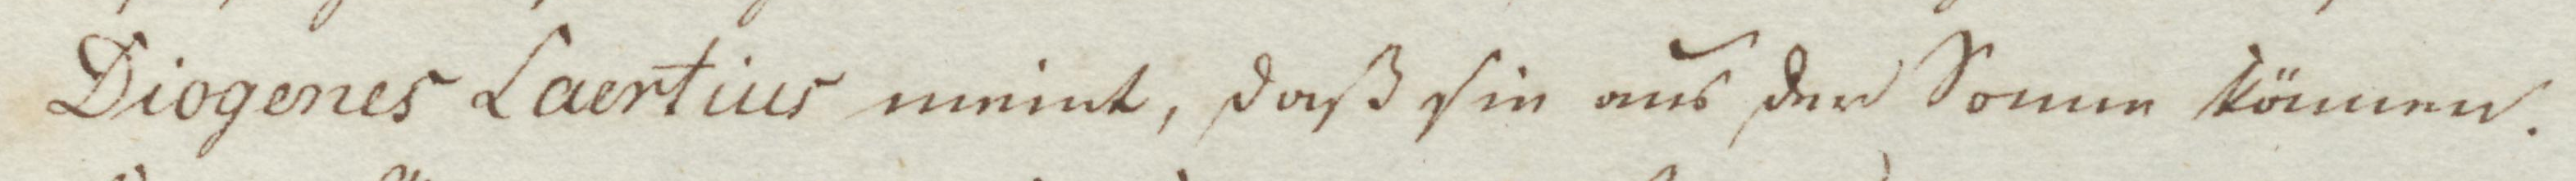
Diogenes Laertius meint, daß sie aus der Sonne kämen.
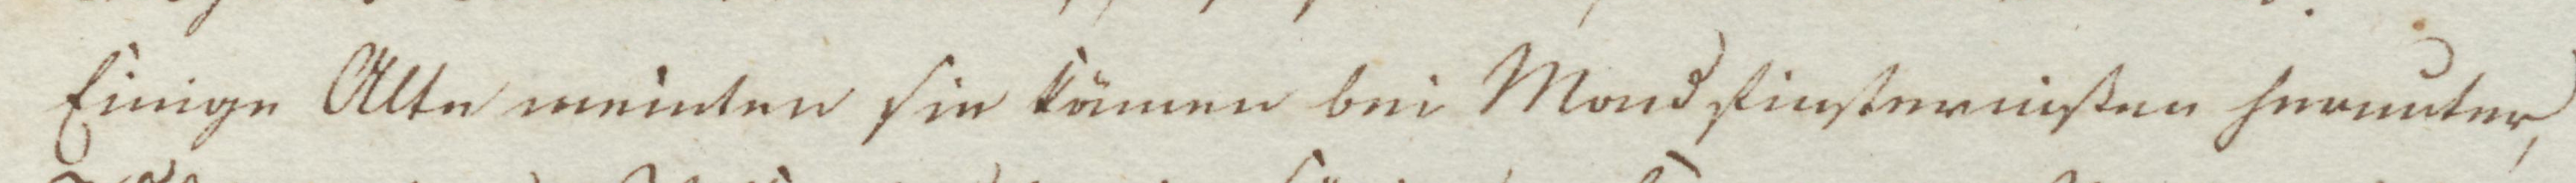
Einige Alte meinten sie kämen bei Mondfinsternißen herunter,
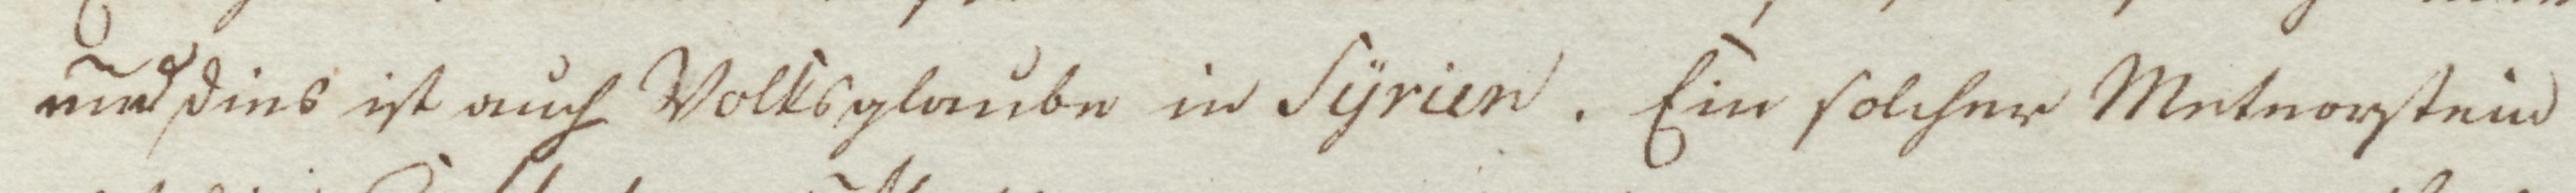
u.und dies ist auch Volksglaube in Sÿrien. Ein solcher Meteorstein
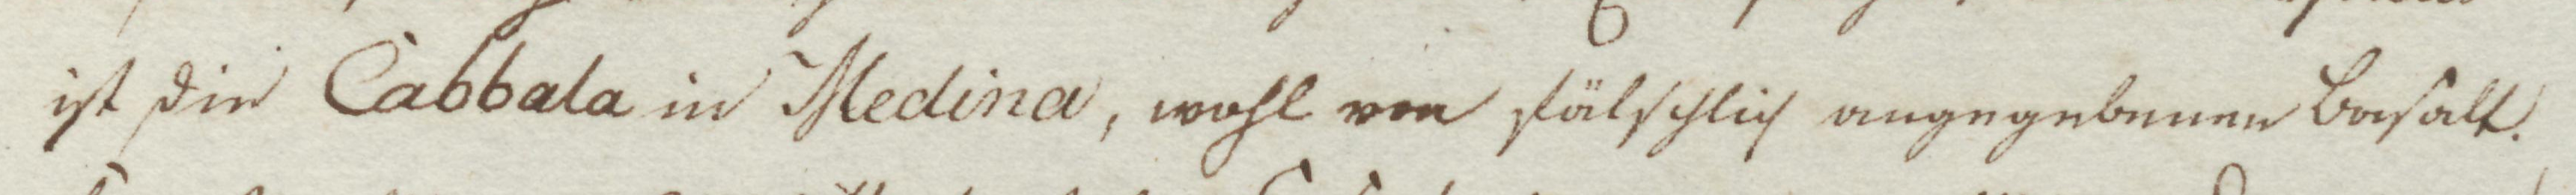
ist die Cabbala in Medina, wohl von fälschlich angegebenen Basalt.
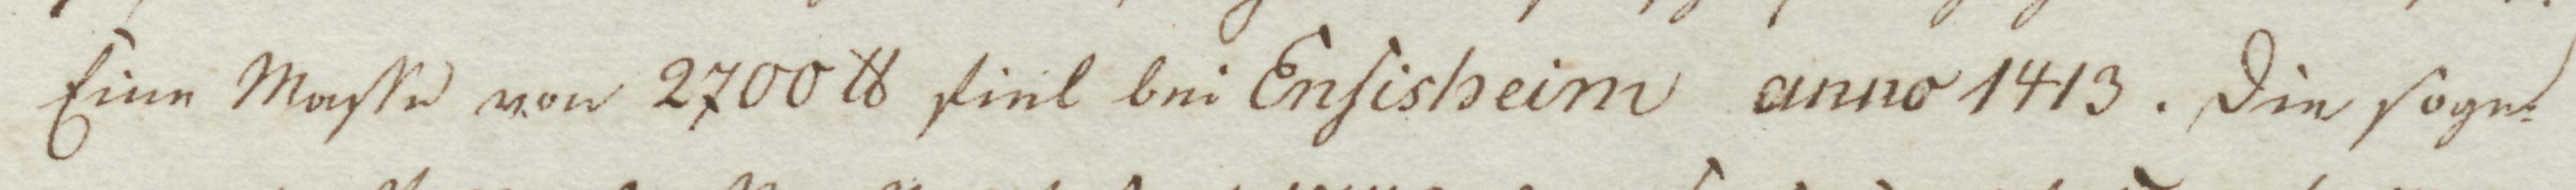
Eine Masse von 2700 ℔ fiel bei Ensisheim anno 1413. Die soge-
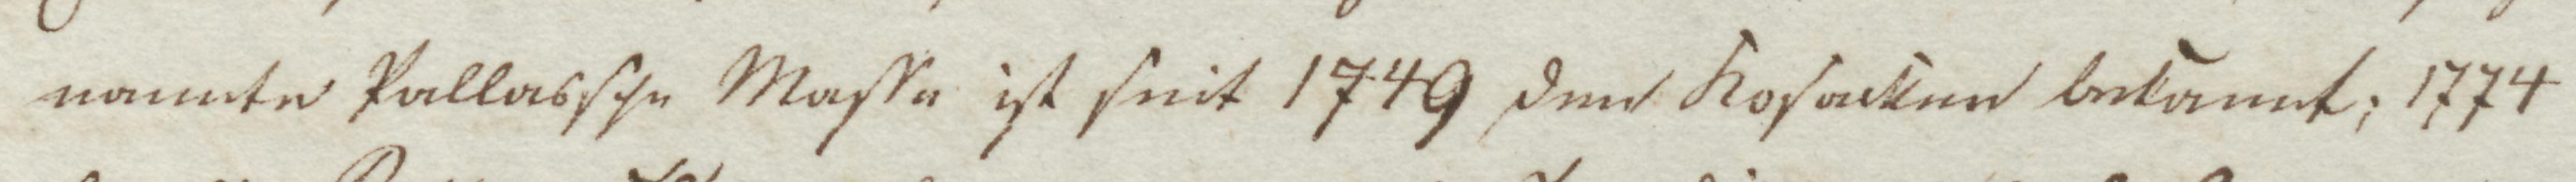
nannte Pallassche Masse ist seit 1749 den Kosacken bekannt; 1774
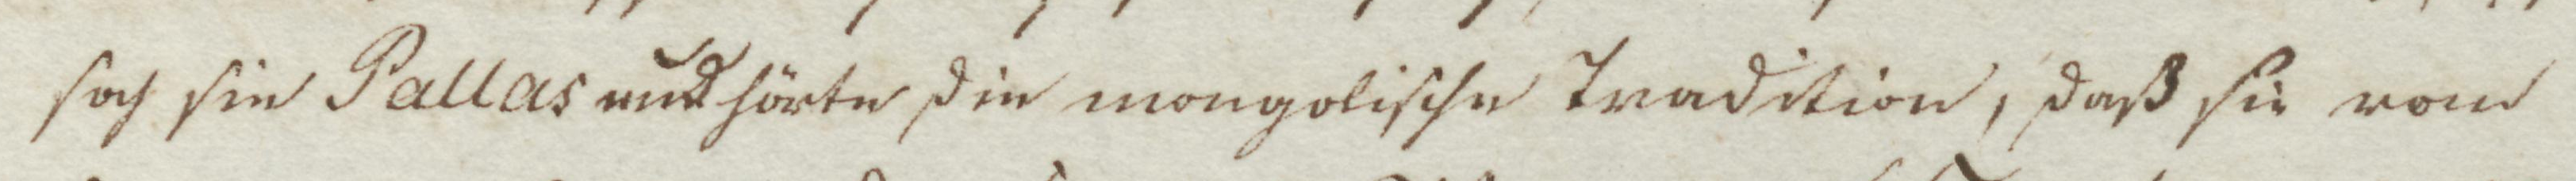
sah sie Pallas u.und hörte die mongolische Tradition, daß sie vom
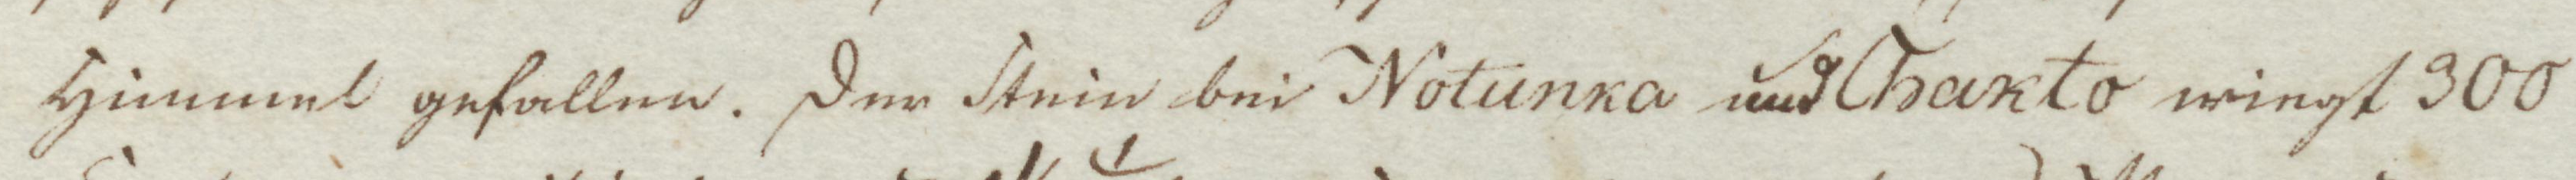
Himmel gefallen. Der Stein bei Notunka u.und Chakto wiegt 300
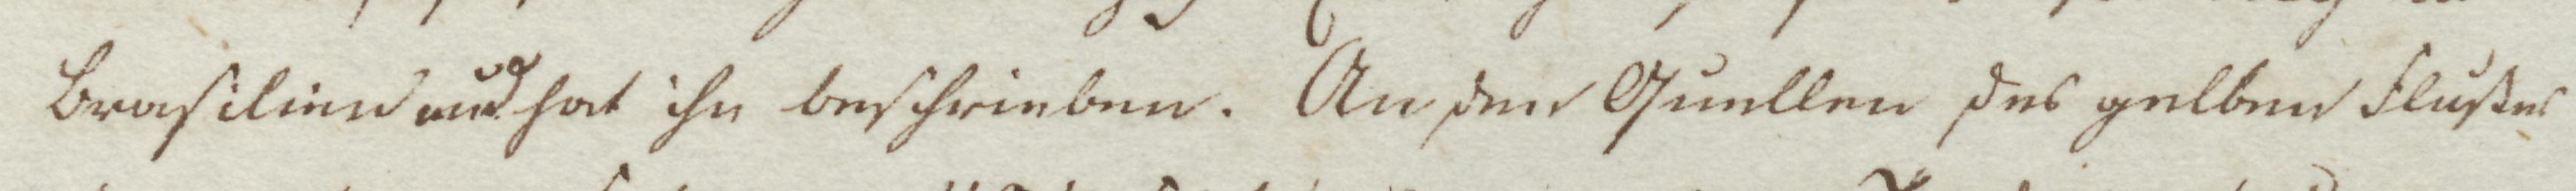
Brasilien u.und hat ihn beschrieben. An den Quellen des gelben Flußes
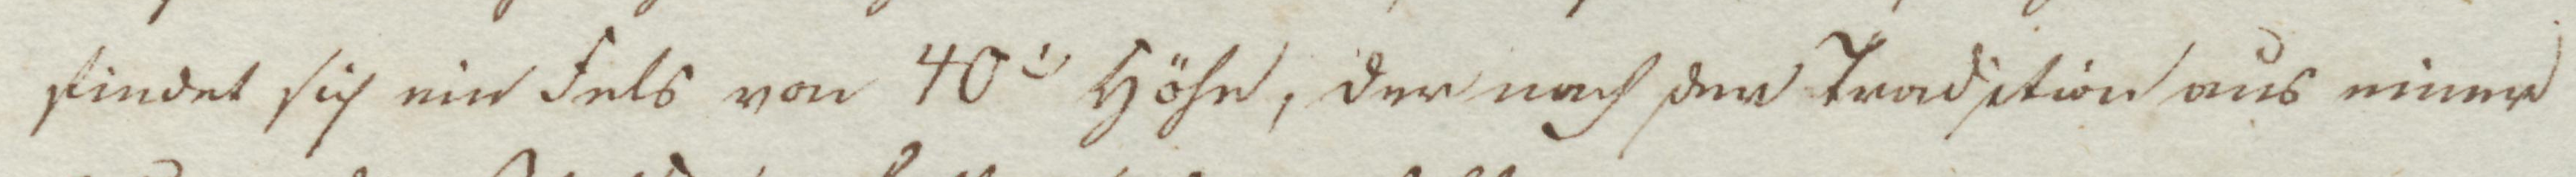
findet sich ein Fels von 40′ Höhe, der nach der Tradition aus einer
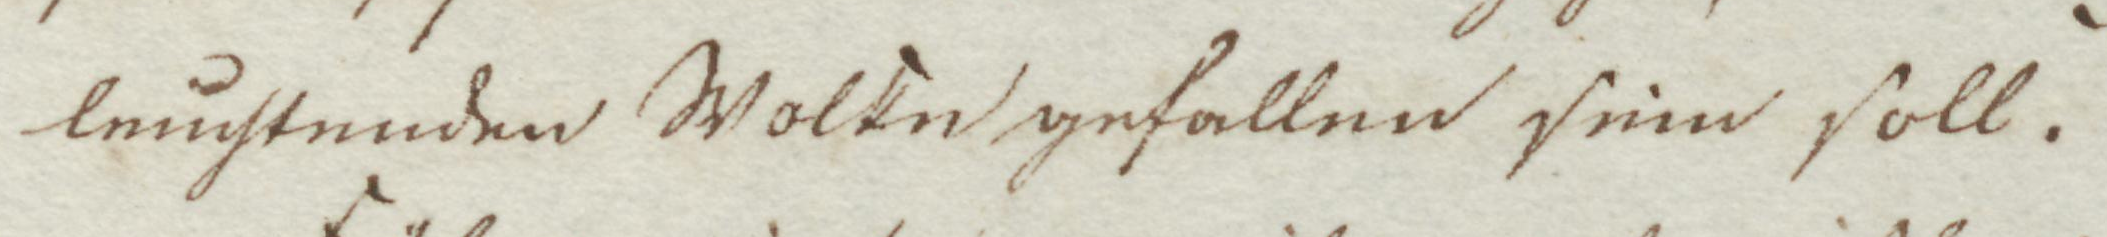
leuchtenden Wolke gefallen sein soll.
